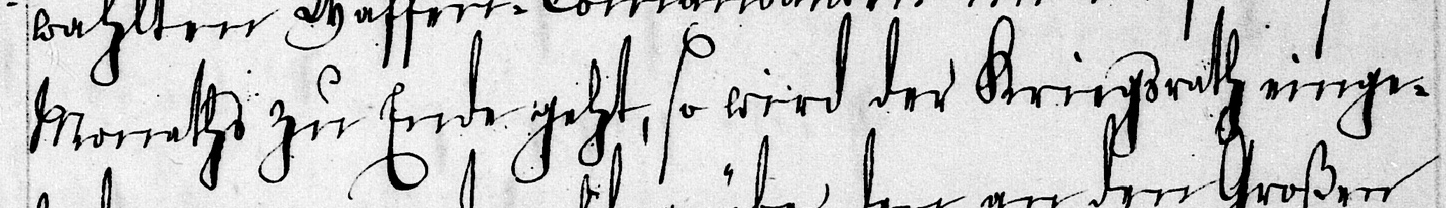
Monaths zu Ende geht, so wird der Kriegsrath einge¬
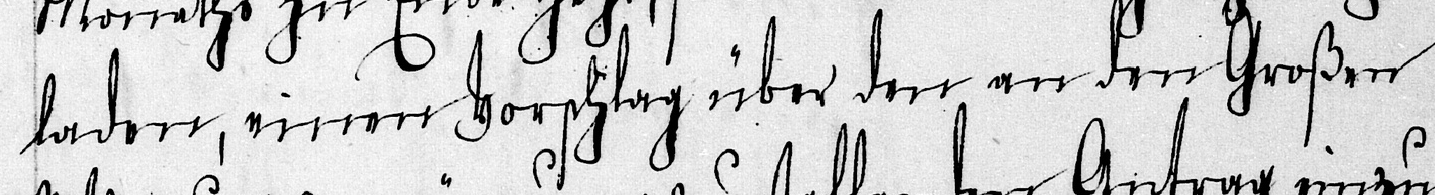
laden, einen Vorschlag über den an den Großen
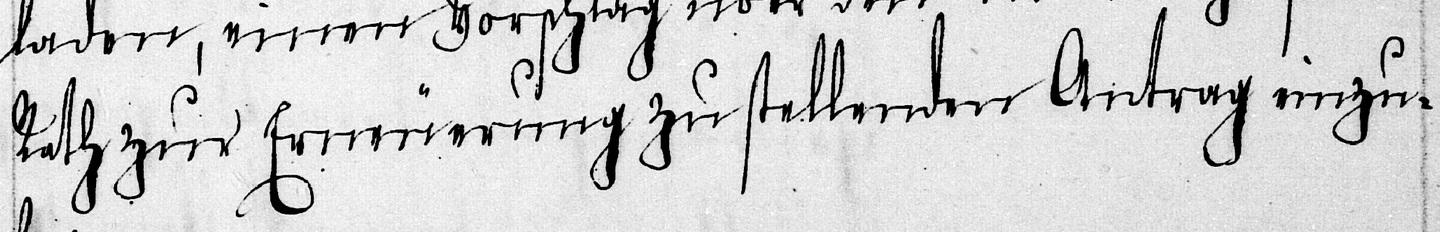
Rath zur Erneuerung zu stellenden Antrag einzu¬
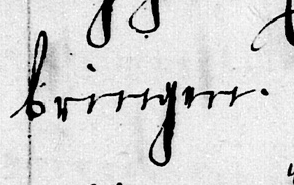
bringen.
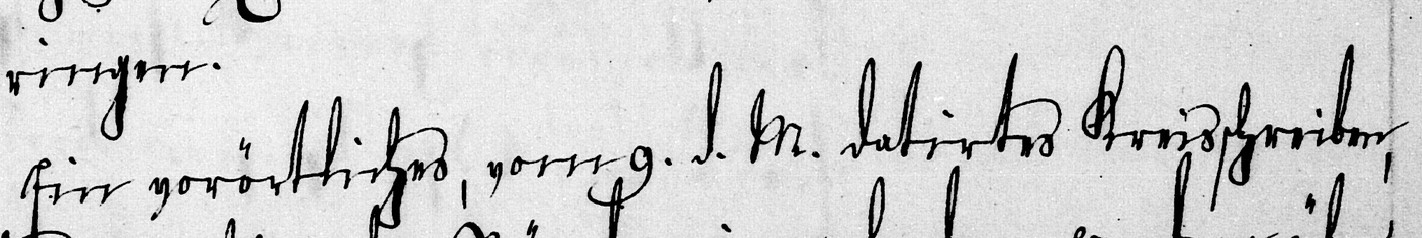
Ein vorörtliches, vom 9. d. M. datirtes Kreisschreiben,
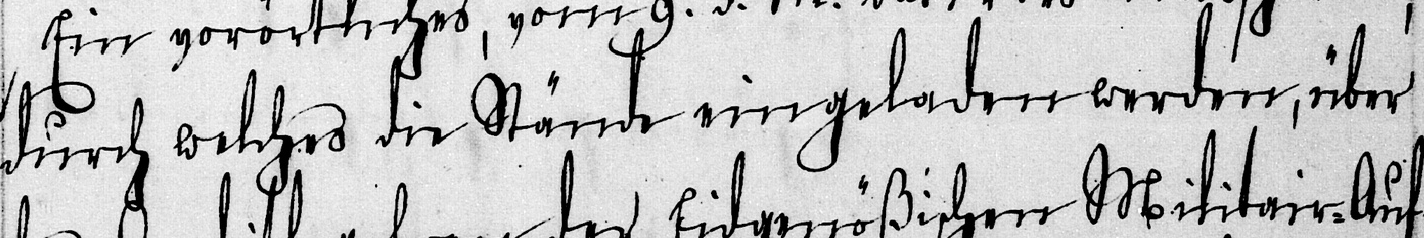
durch welches die Stände eingeladen werden, über
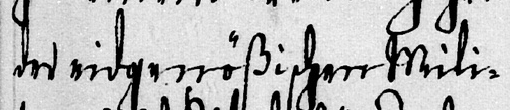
der Eidgenößischen Mili¬
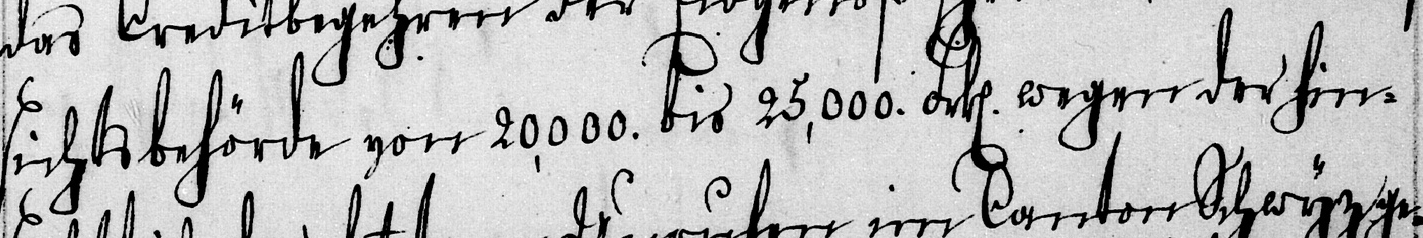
sichtsbehörde von 20'000. bis 25'000 Frk[en]. wegen der hin¬
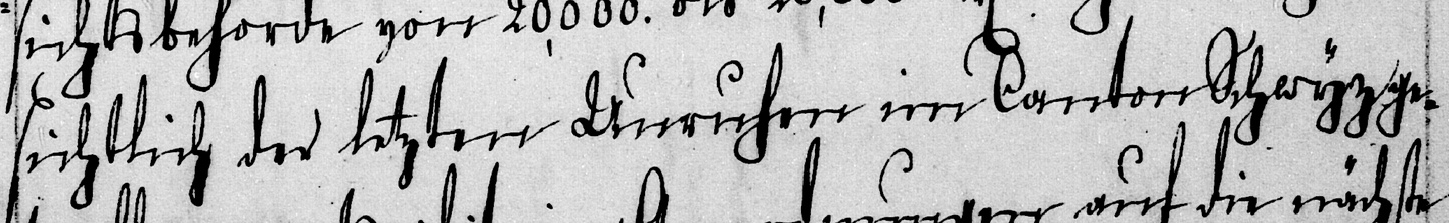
sichtlich der letzten Unruhen im Canton Schwyz ge¬
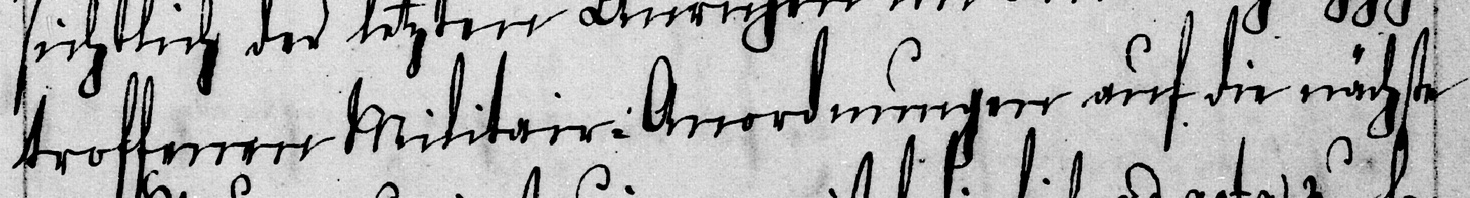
troffenen Militair-Anordnungen auf die nächste
